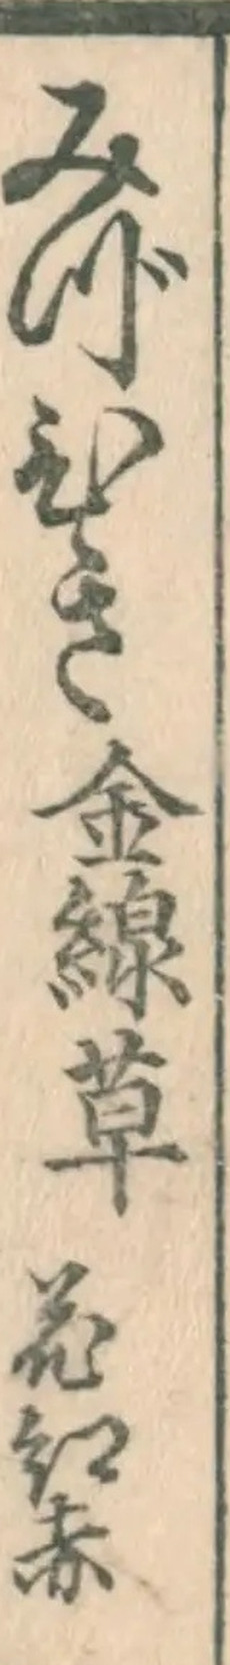みづひき金線草花紅亜
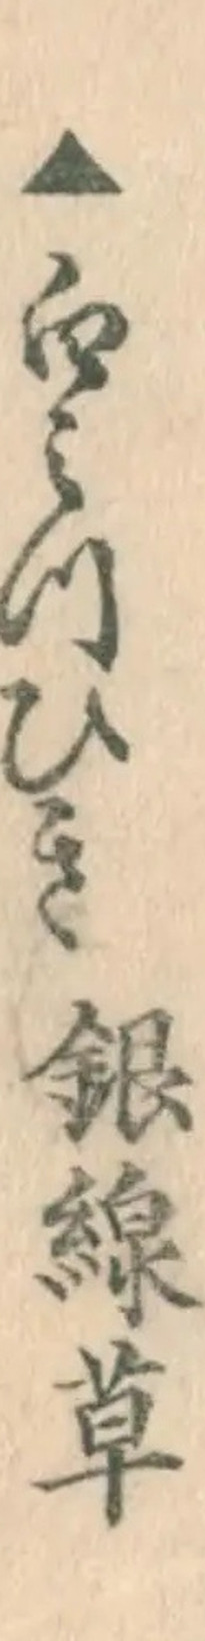▲白ミつひき銀線草
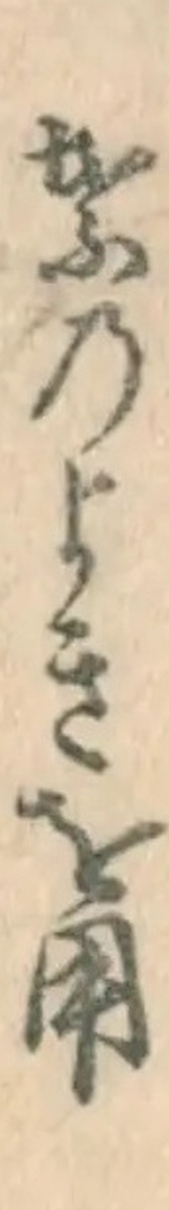葉のよきを用

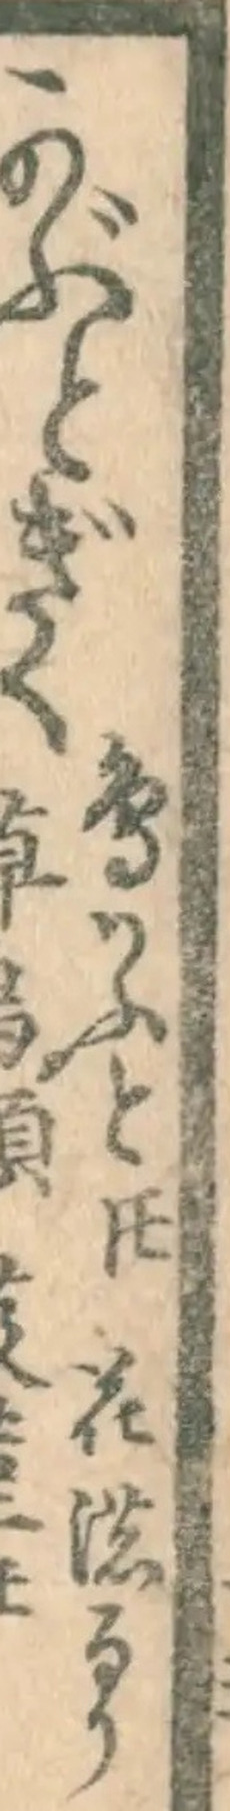のぶとぎく鳥かふと共花濃いゆり
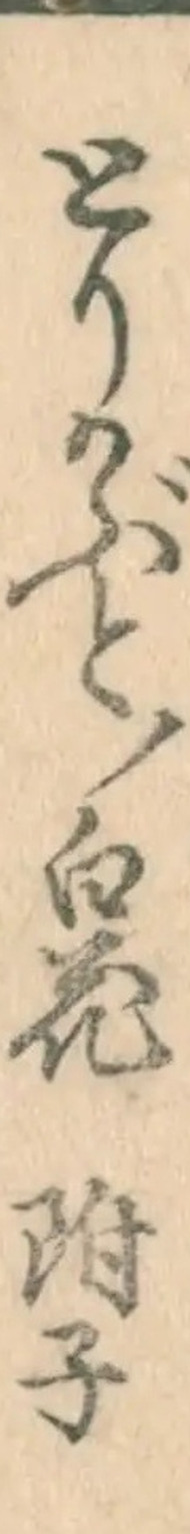とりかぶとノ白花附子
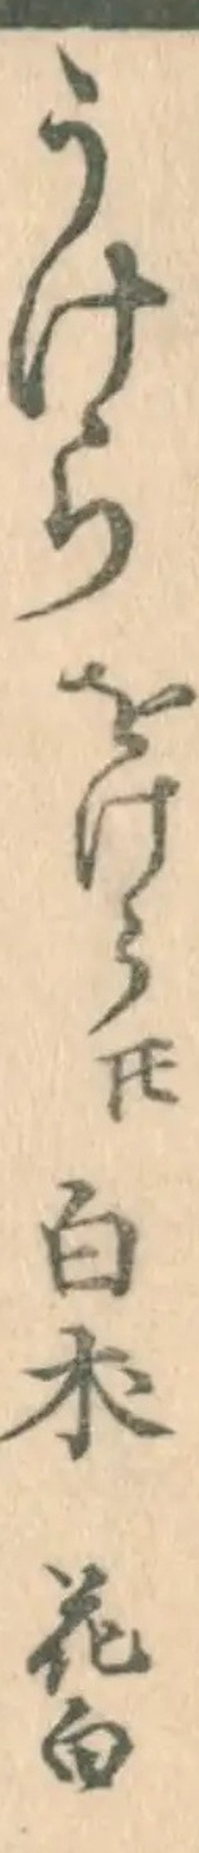うけらをけら共白木花白
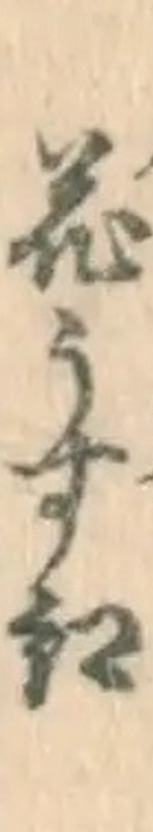花うす紅
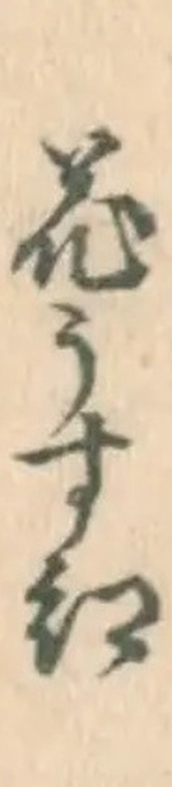花うす紅
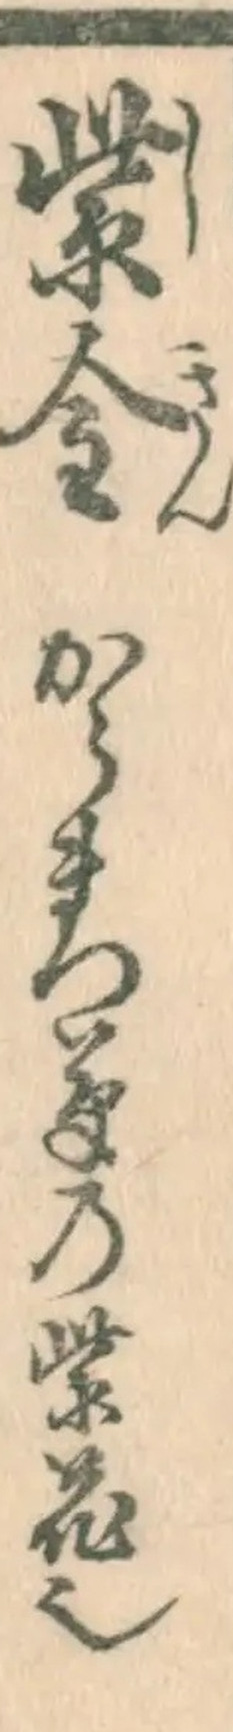紫金かうまつ草の紫花也
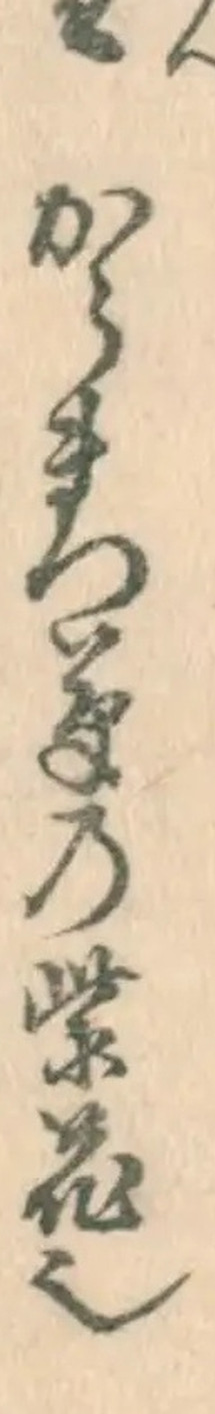紫金かうまつ草の紫花也
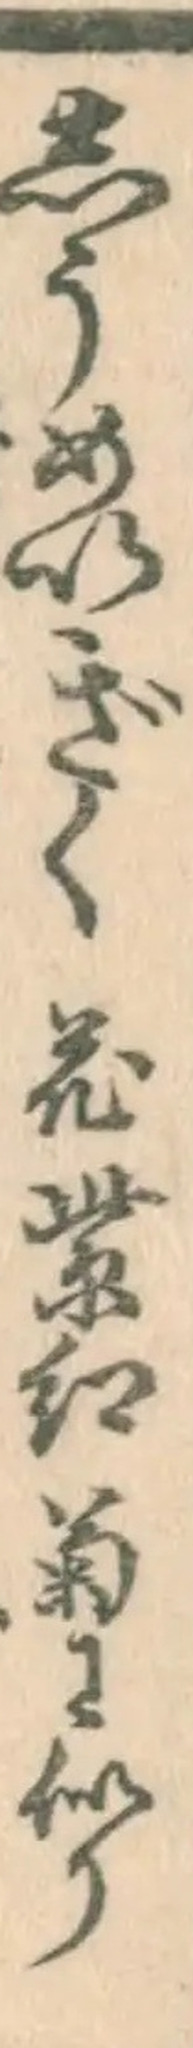しうめいぎく花紫紅菊に似り
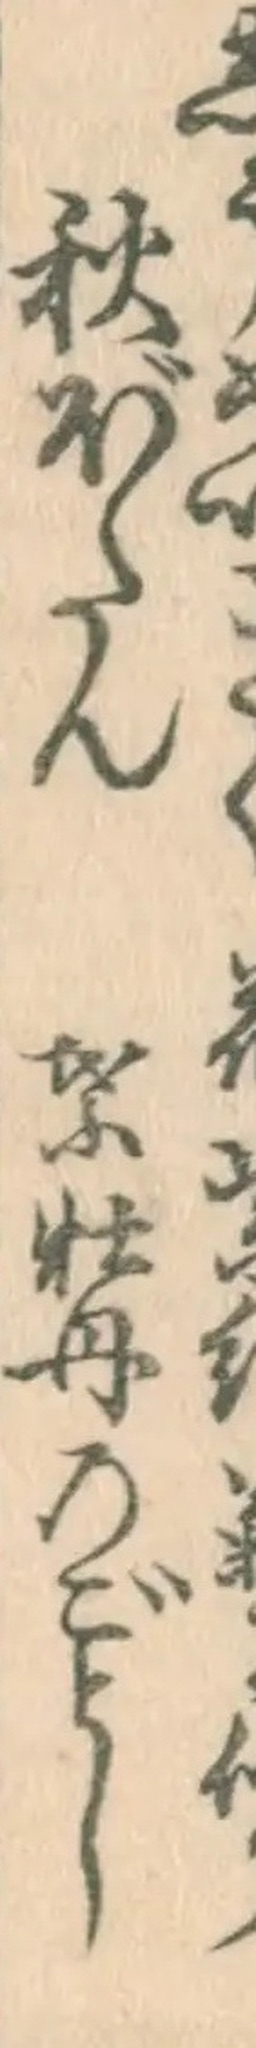秋ぼたん葉ぼたんのごとし
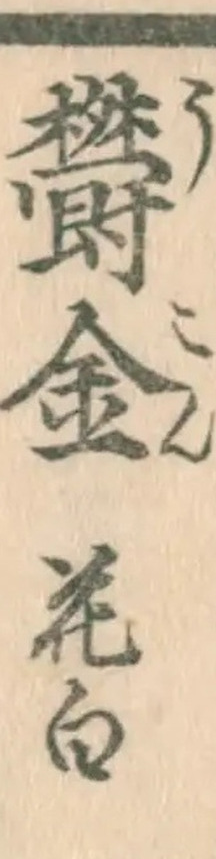欝金花白
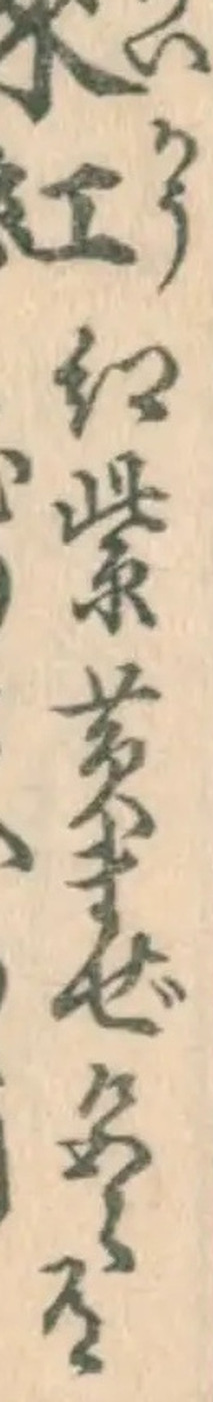鴈來紅紅紫黄まぜ色々有
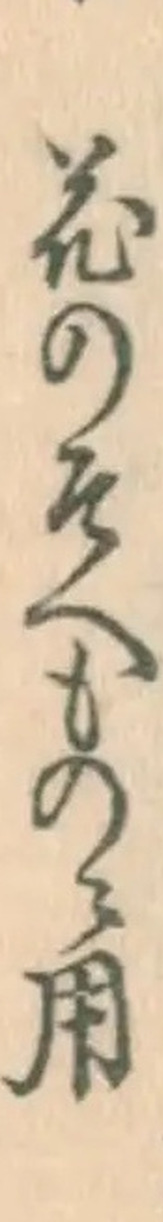花のそへものゝ用
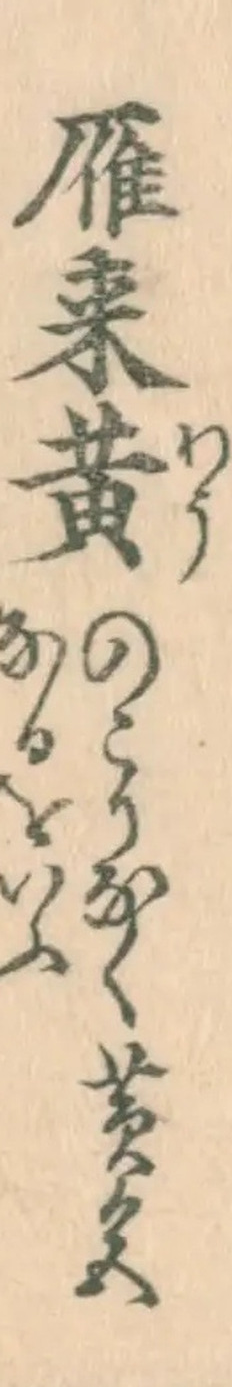鴈來黄のこりきく黄色
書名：茶席挿花集
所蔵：国立国会図書館 National Diet Library, JAPAN
